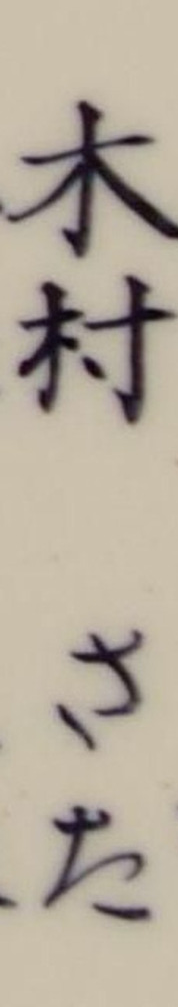木村さた
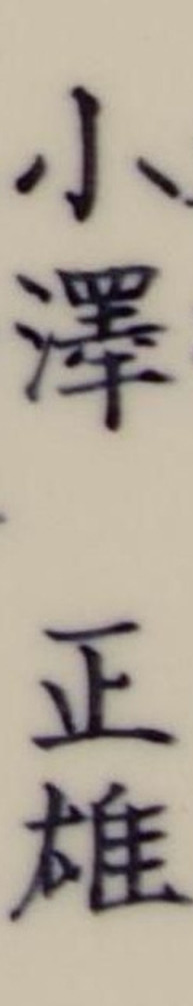小澤正雄
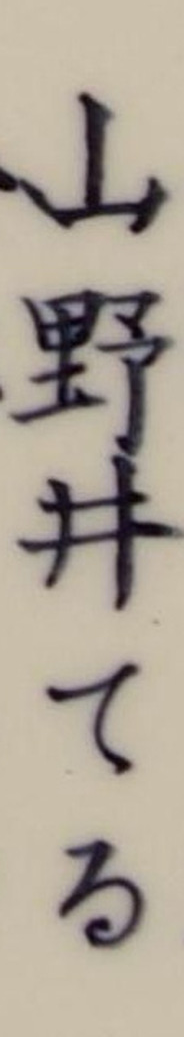山野井てる
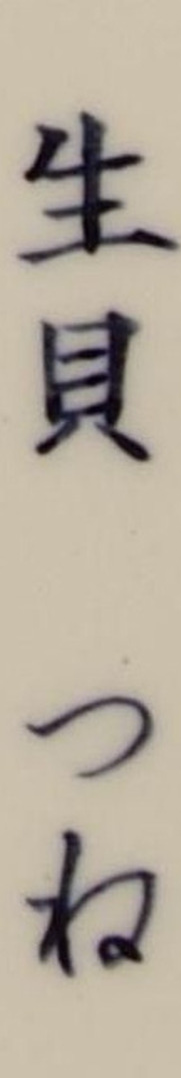生貝つね
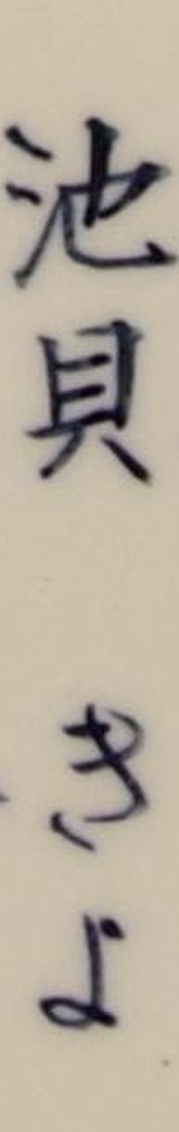池貝きよ
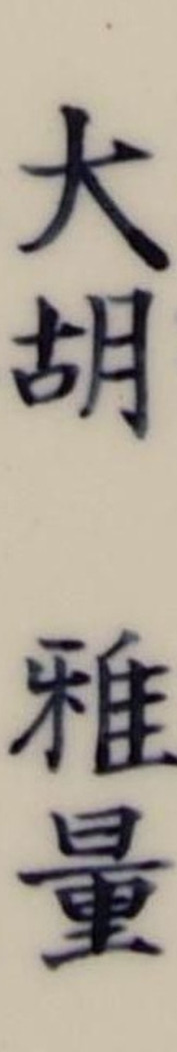大胡雅量
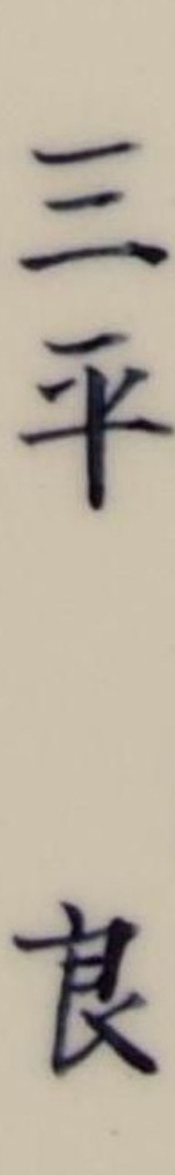三平良
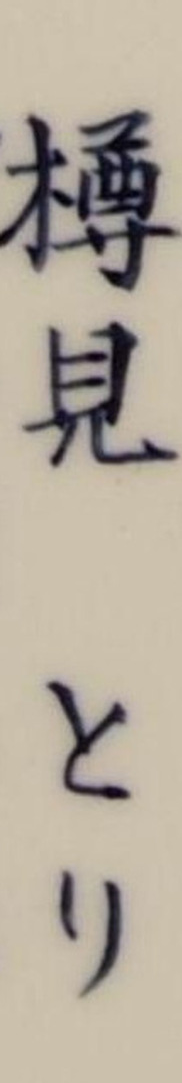樽見とり
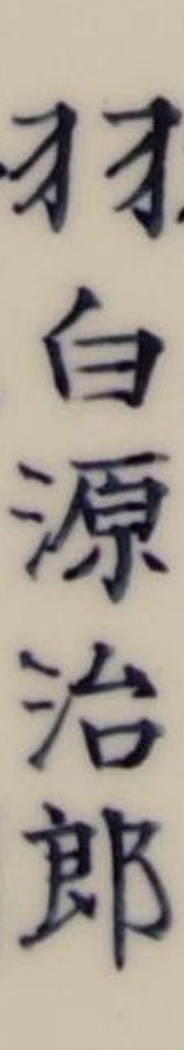羽白源治郎
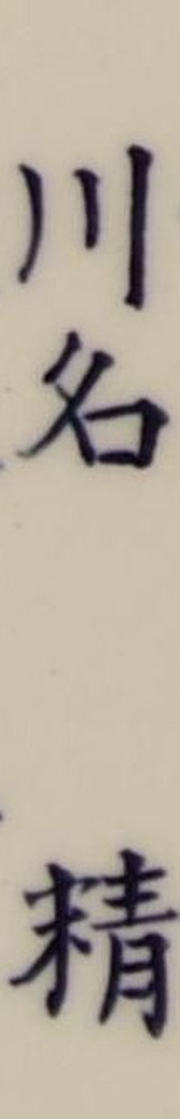川名精
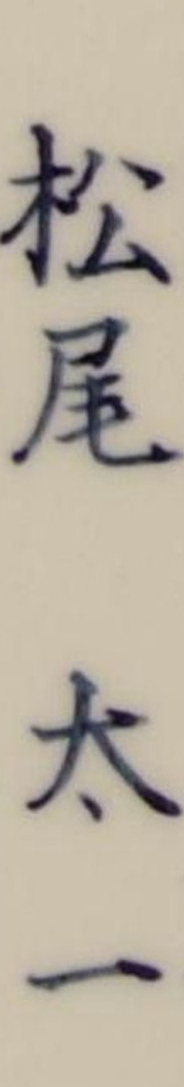松尾太一
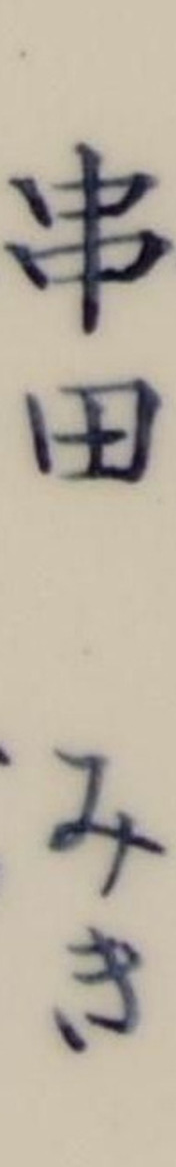串田みき

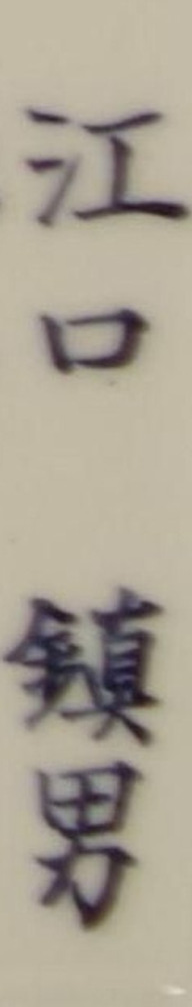江口鎮男
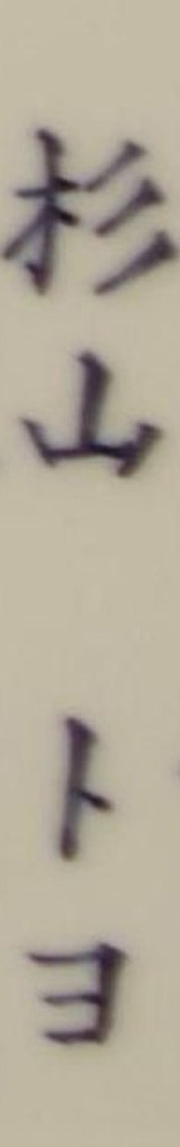杉山トヨ
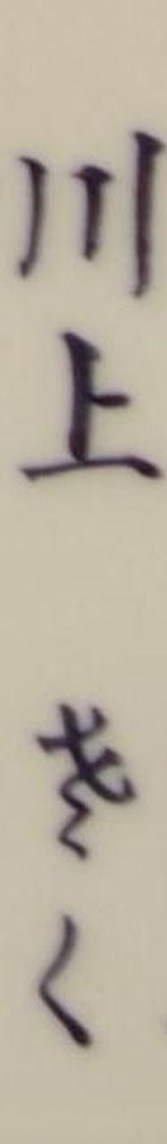川上さく
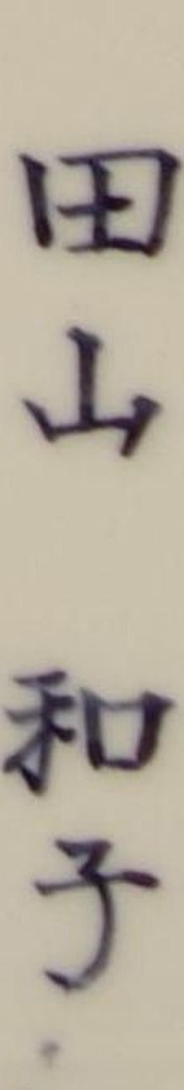田山和子
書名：E~L
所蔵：高野山金剛峯寺
